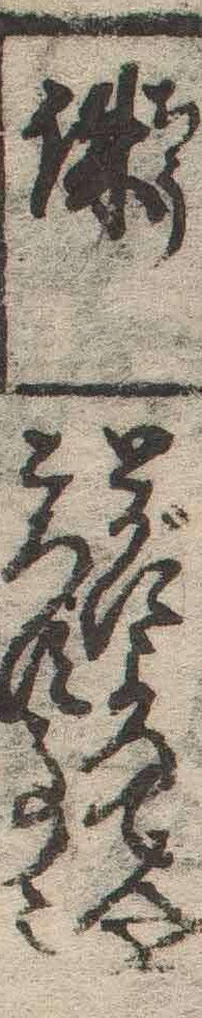誅とがによつて人を
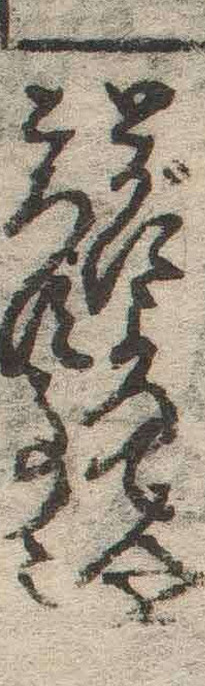誅とがによつて人を
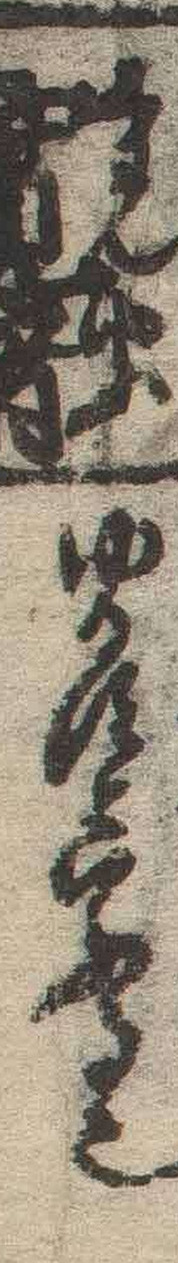寛宥ゆるすといふ事也
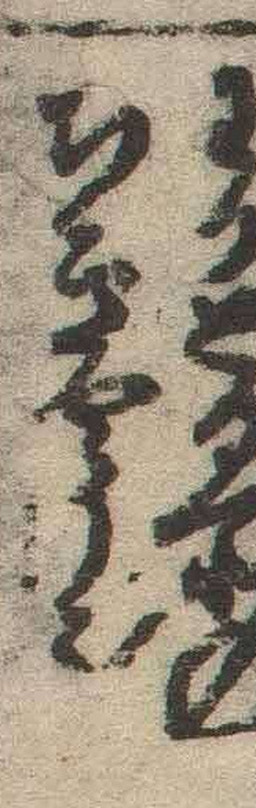ちぎやう也
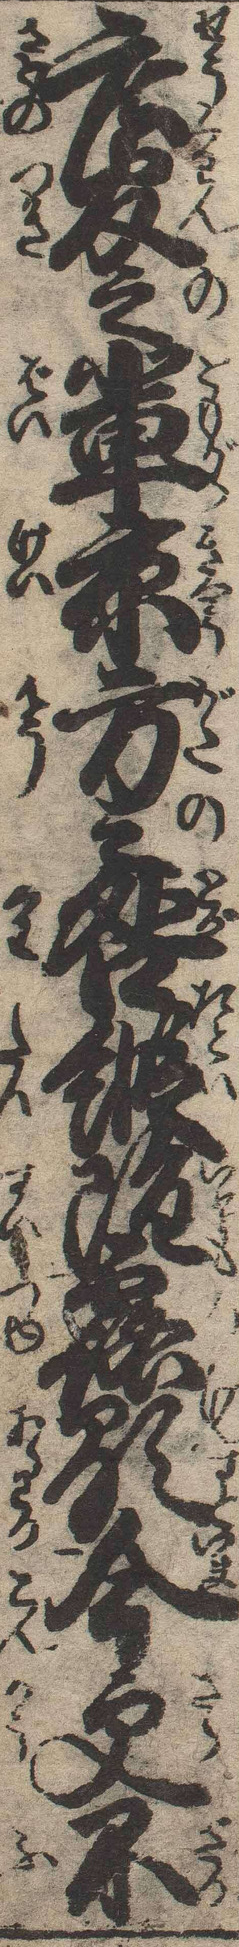庄官之輩京方之咎縦雖露顕今更不

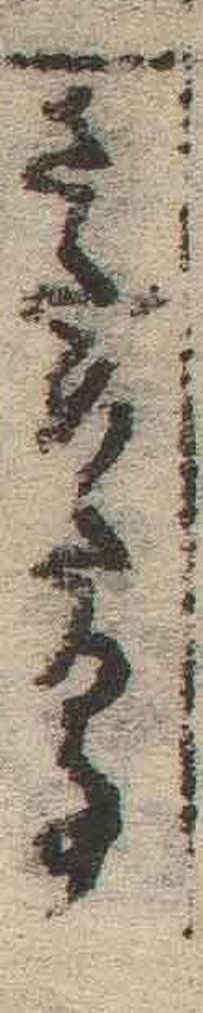さりたる事
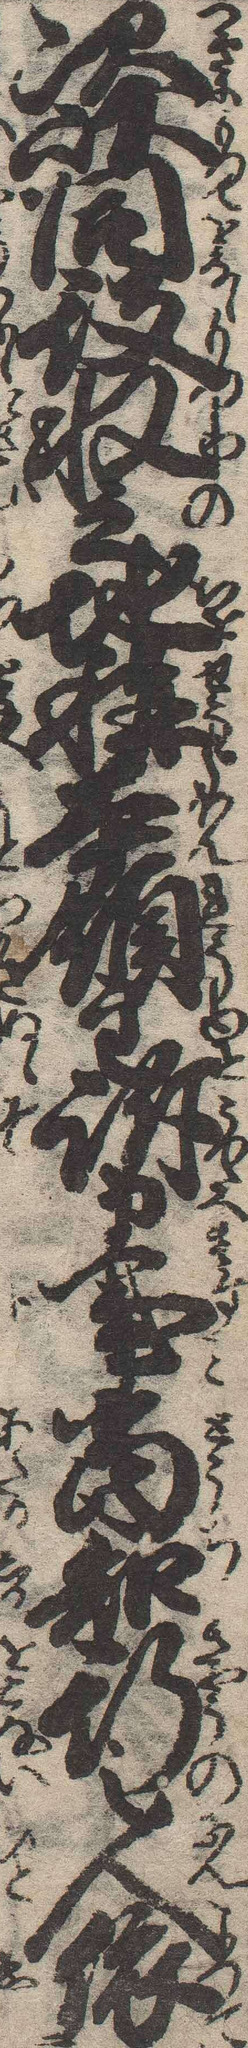次以同没収之地称本領主訴申事當知行之人依
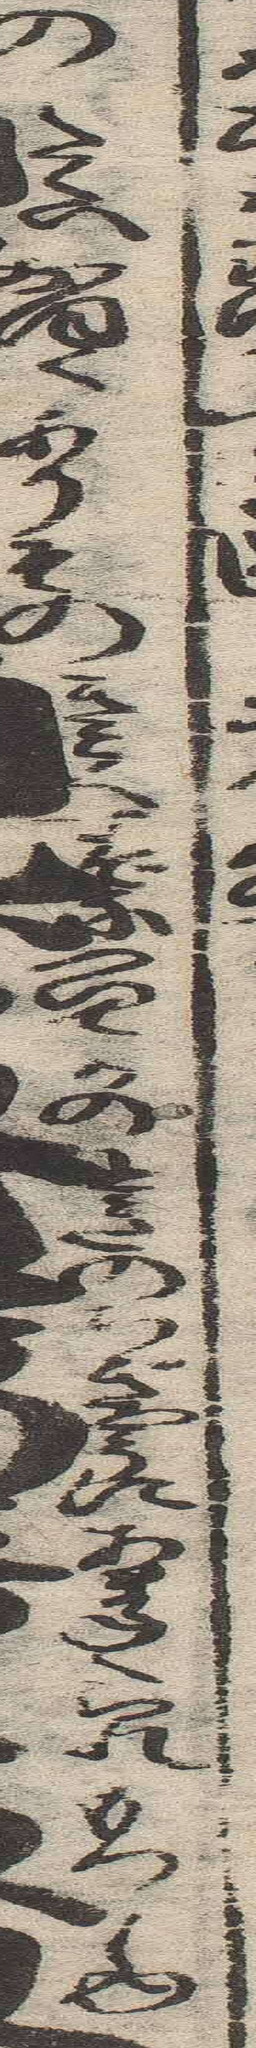のたくいおほくありそのきこへすでについてかのときのちぎやうにあまねくられもつしゆ
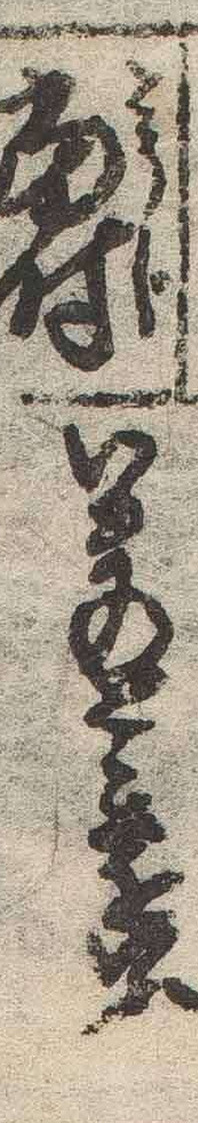當時いまのときをいふ
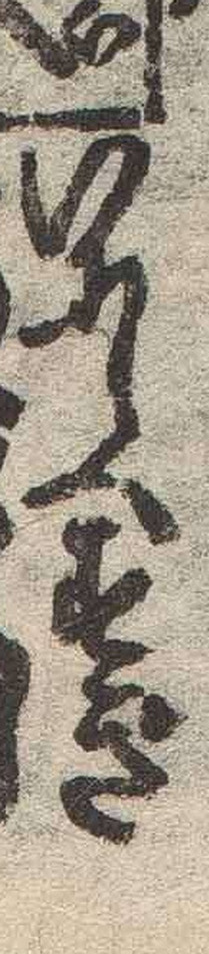往代いにしへすぎ
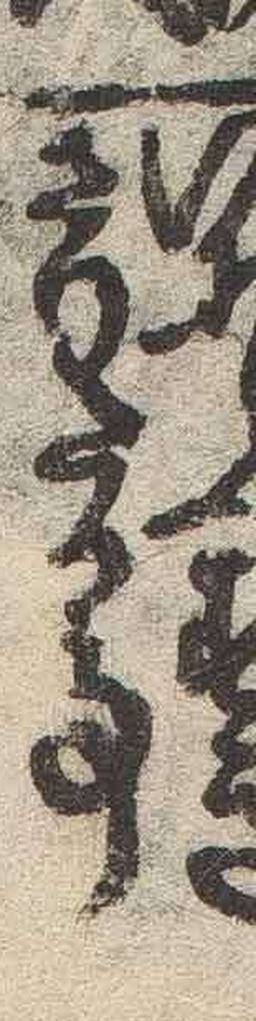さりたる事
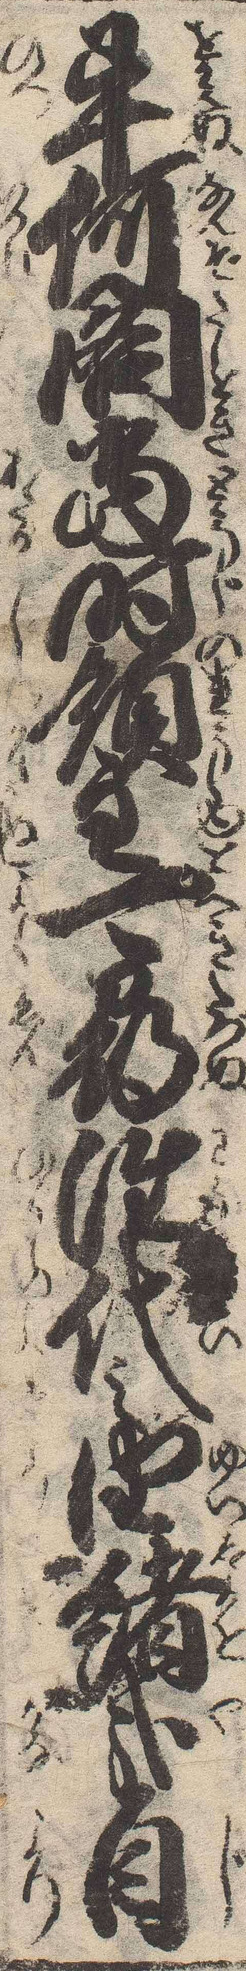畢何閣當時領主可尋往代之由緒欤自
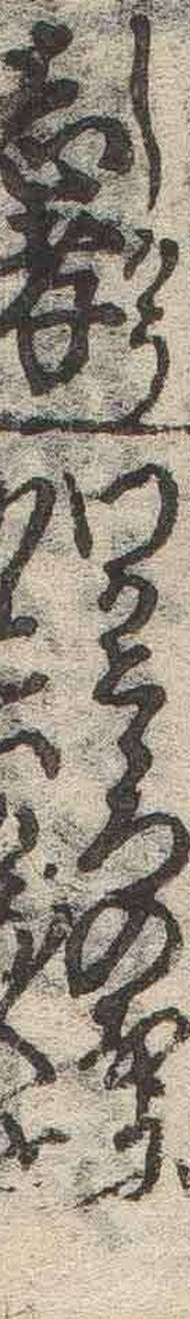志孝わかこころのなに
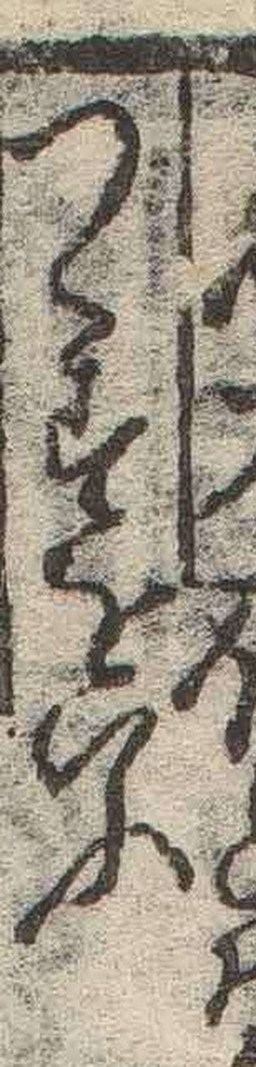つくすをいふ
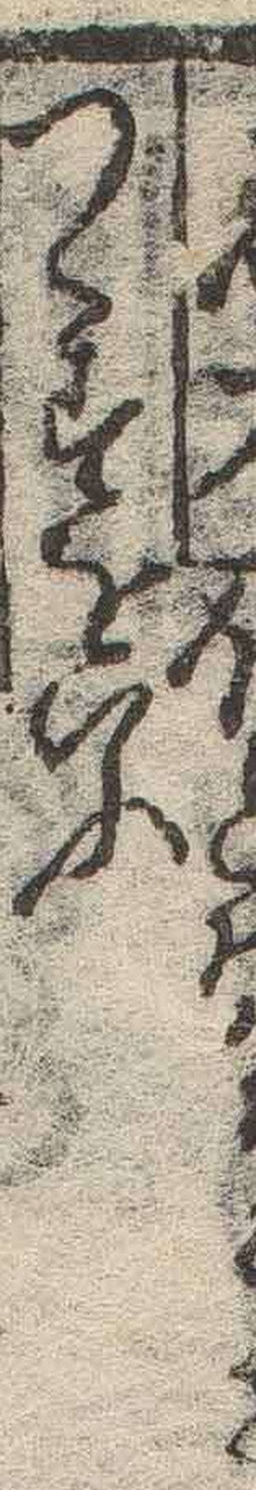つくすをいふ
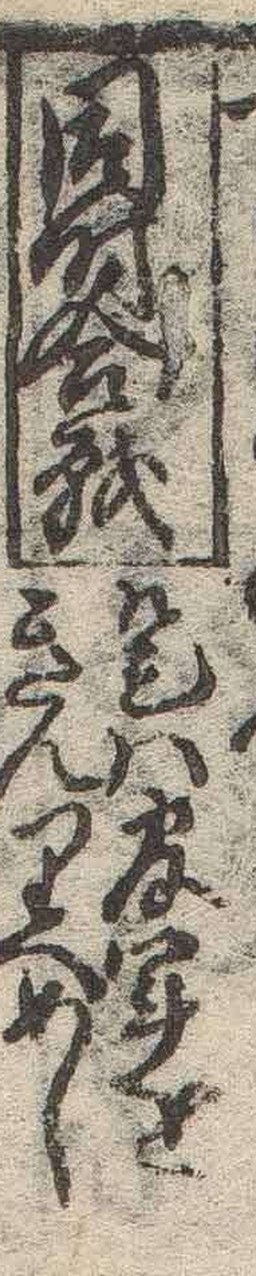同時合戦是は官軍を
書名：御成敗式目絵抄
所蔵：東京学芸大学附属図書館 国文学研究資料館
